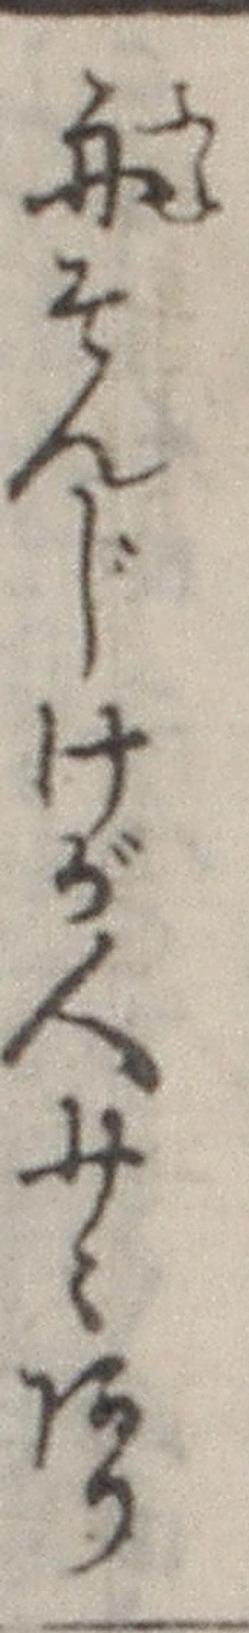舟そんじけが人少々あり
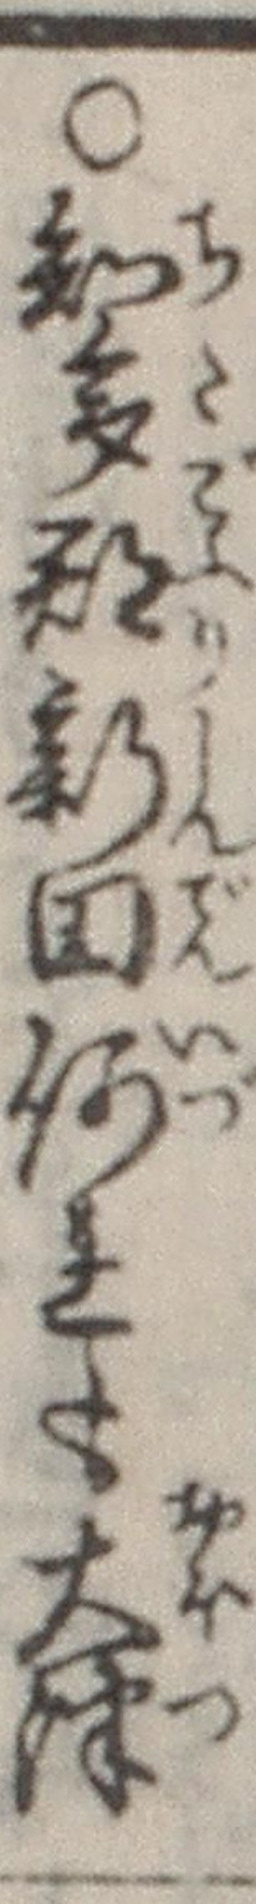○知多郡新田何れも大津
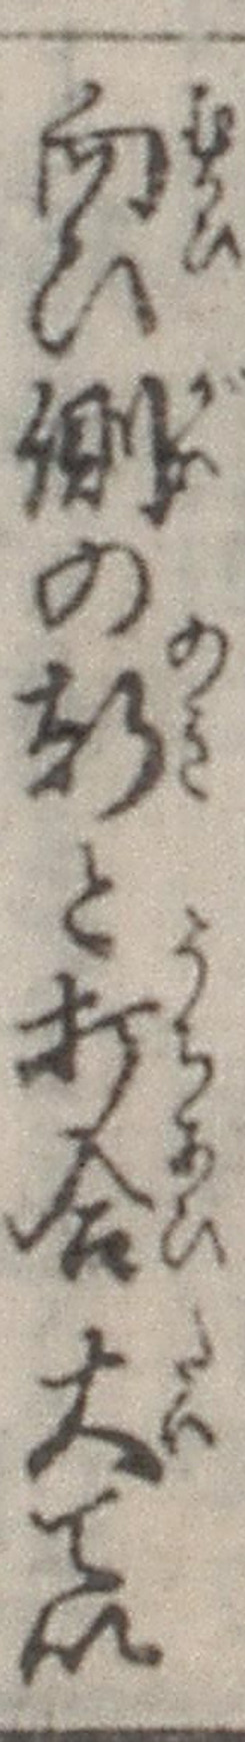向ひ側の軒と打合大てい
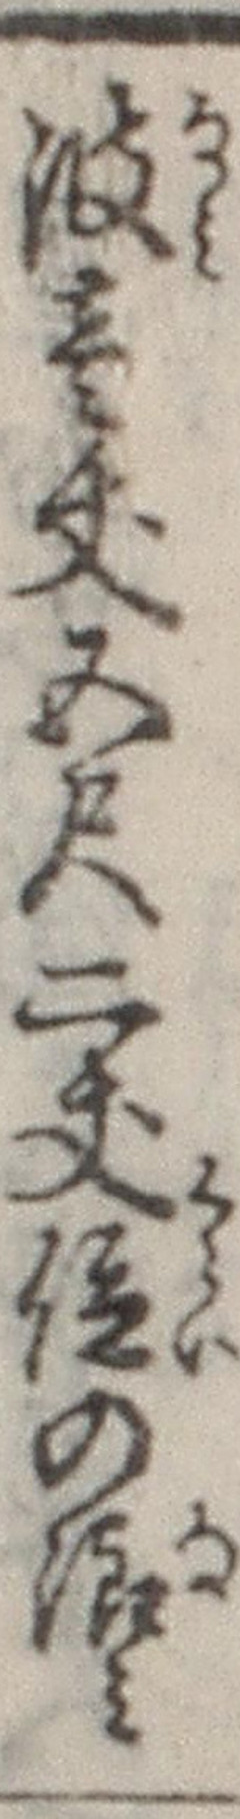波壹丈五尺二丈位の浪み
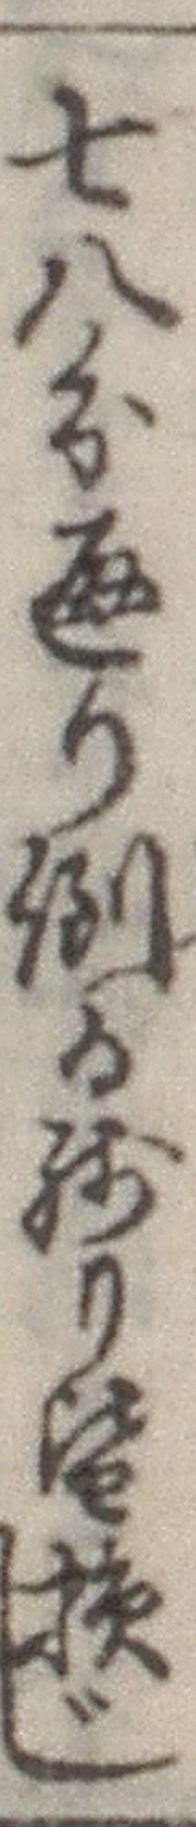七八分通り倒る残り皆損じ
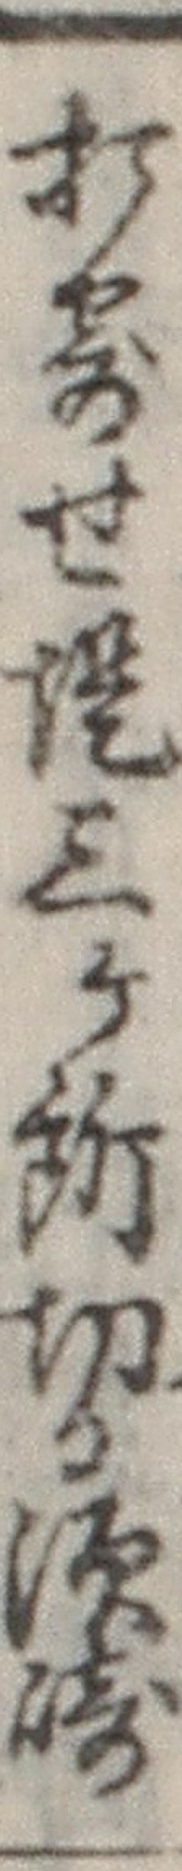打寄せ堤三ヶ所切る須崎
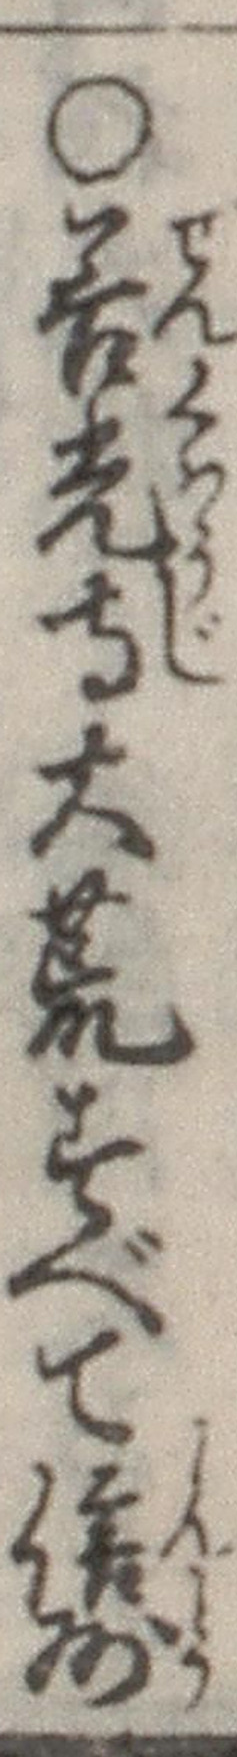○善光寺大荒すべて信州
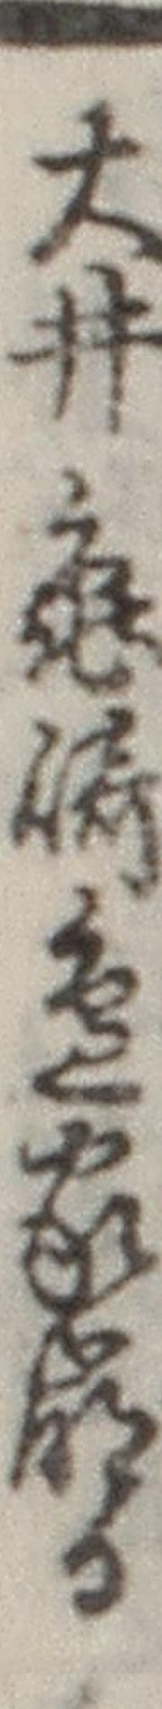大井亀崎辺家崩る
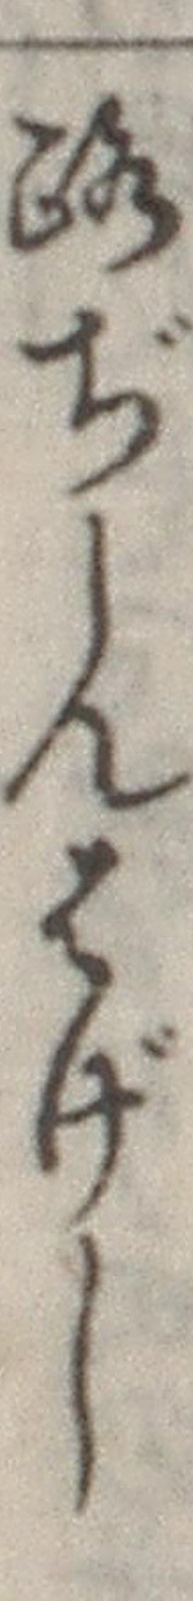路ぢしんはげし
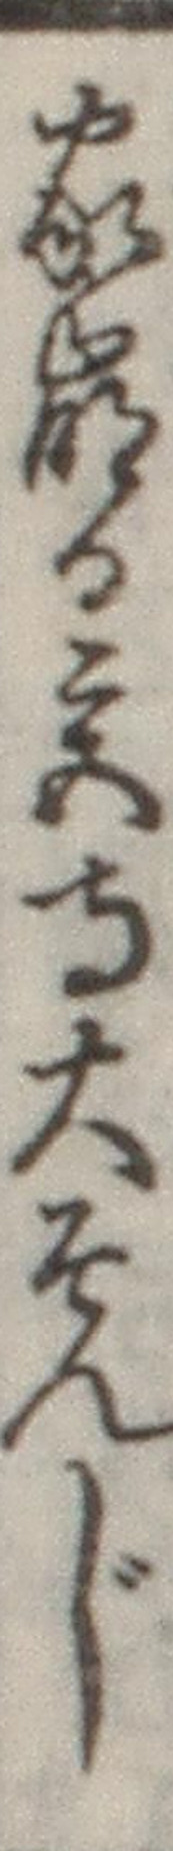家崩る宮寺大そんじ
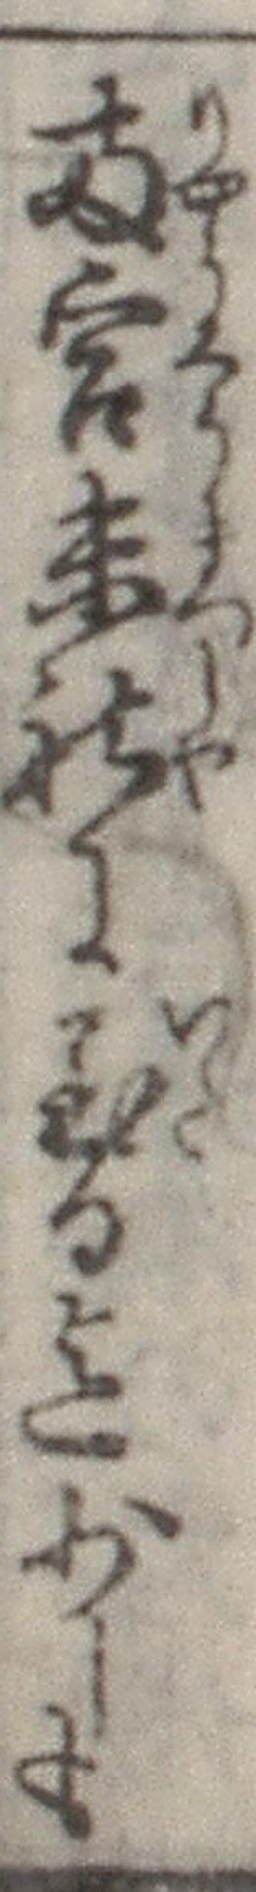両宮末社に至る迄少しも
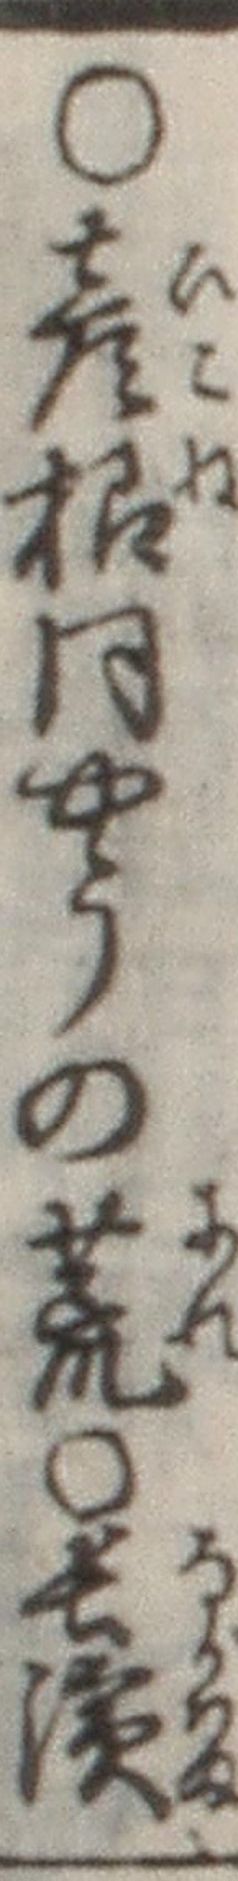○彦根同やうの荒○長濱
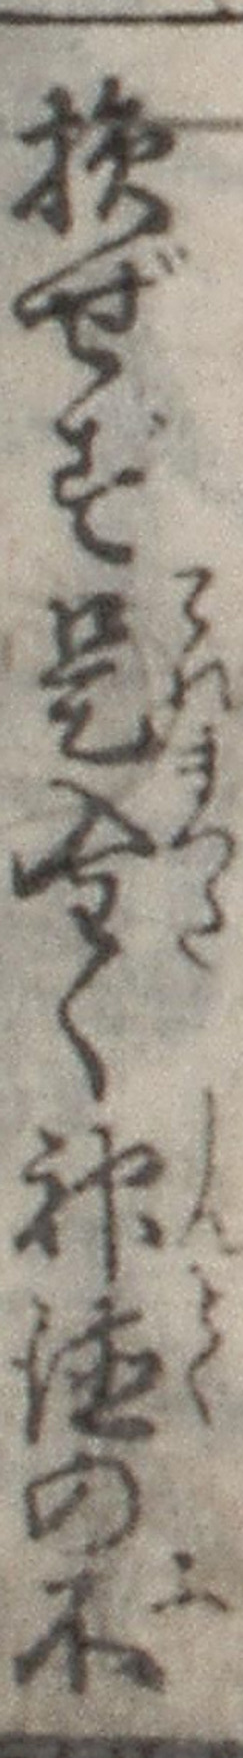損ぜす是全く神徳の不
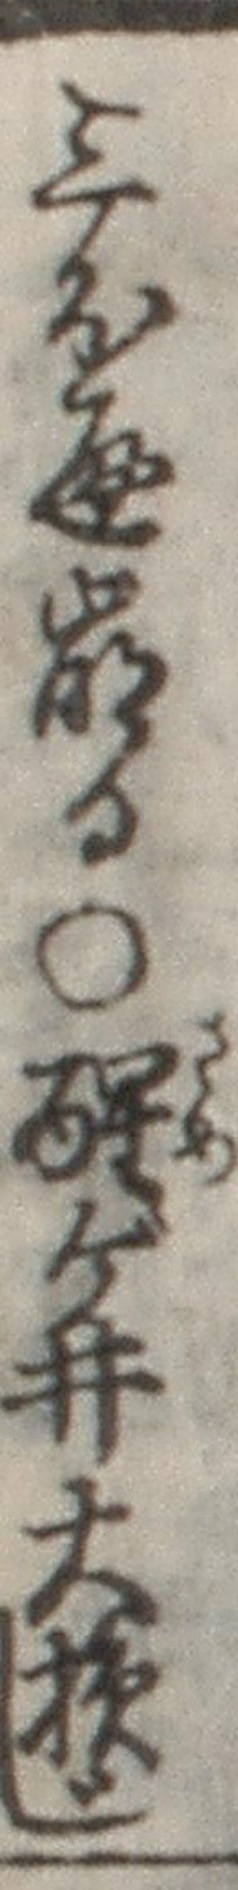三分通崩る○醒ケ井大損じ
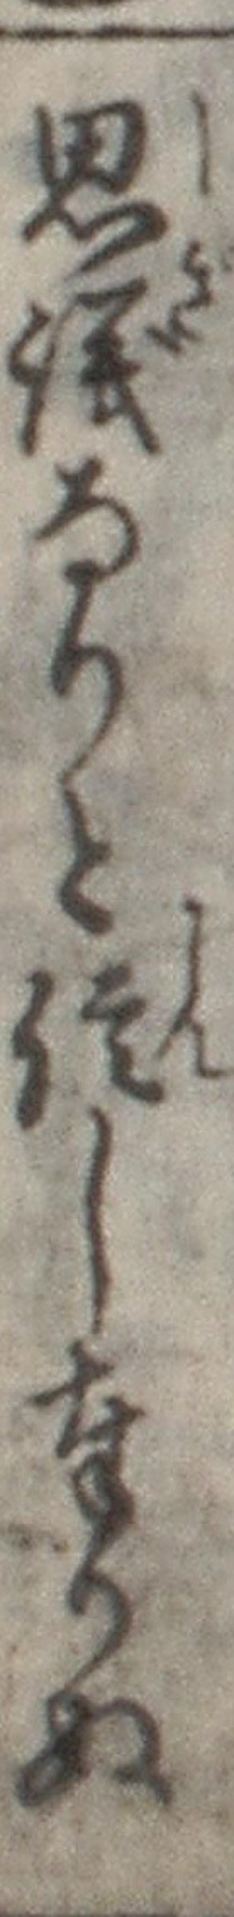思議なりと信し奉りぬ

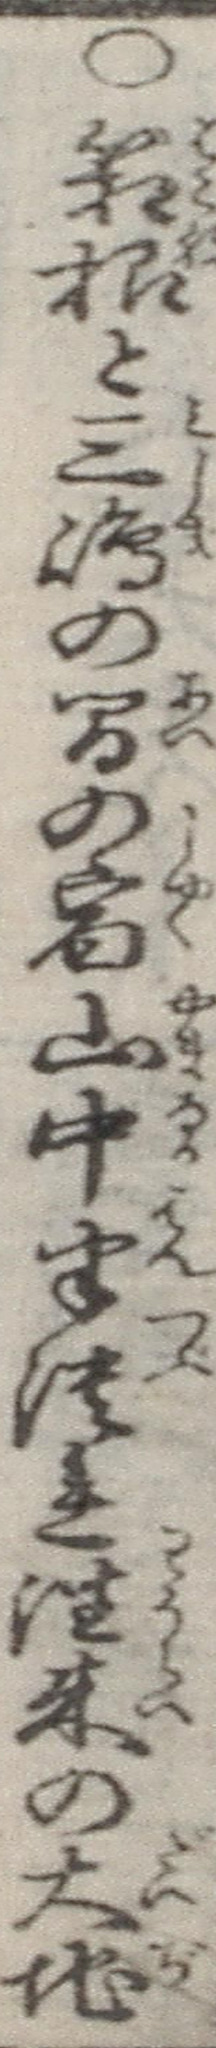○箱根と三嶋の間の宿山中半潰れ往来の大地
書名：諸國大地震年代記　末代噺種
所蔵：東京大学地震研究所図書室 Earthquake Research Institute Library, The University of Tokyo, JAPAN
